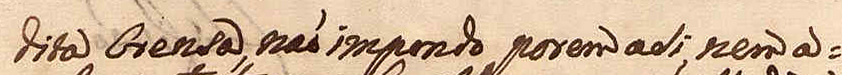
dita Crensa, naõ impondo porem a si, nem a
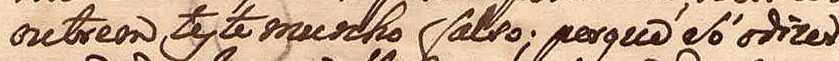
outrem testemunho falso; porque só o dizer
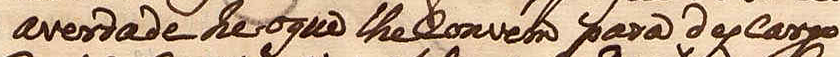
a verdade he o que lhe convem para descargo
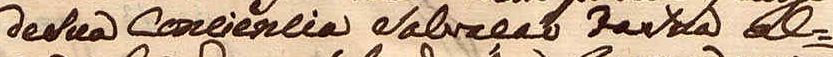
de sua conciencia salvaçaõ da sua al
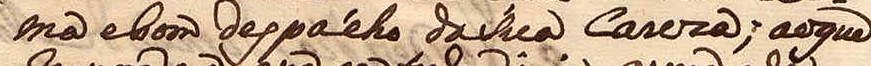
ma e bom despacho da Sua Cauza; ao que
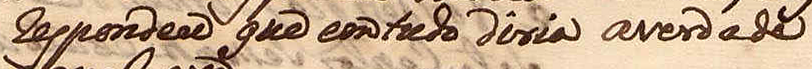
Respondeu que em tudo diria a verdade
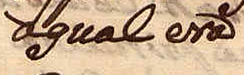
a qual era
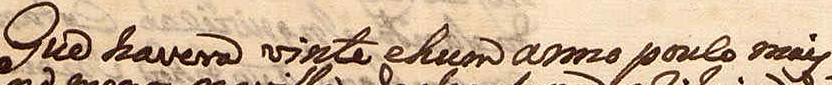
Que havera vinte e hum anno pouco mais
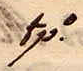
tp.o
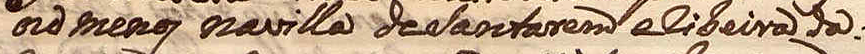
ou menos na villa de Santarem e Ribeira da
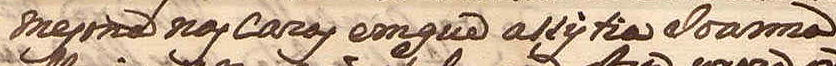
mesma nas cazas em que assistia Ioanna
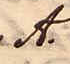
A.
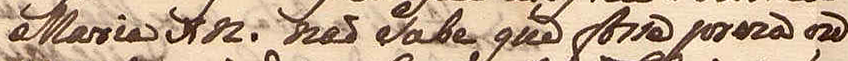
Maria xn. naõ sabe que fosse preza, ou
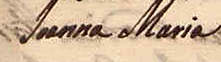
Ioanna Maria
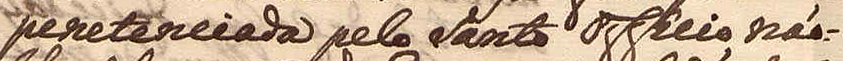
penetenciada pelo Santo oficio nao
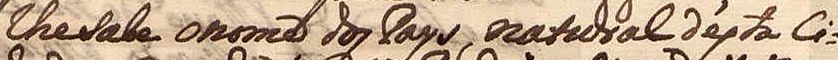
lhe sabe o nome dos Pays, natural desta ci
